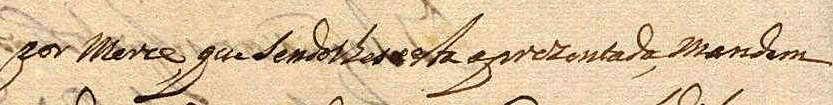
por Merce, que sendolhes nesta aprezentada, mandem
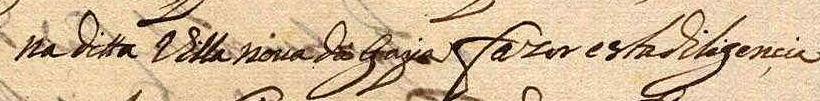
na ditta Villa noua da Gaya fazer esta diligençia
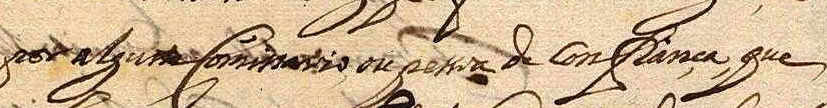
por algum Comissario, ou pessoa de confiança, que
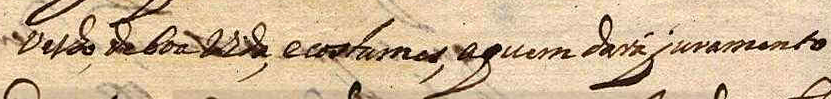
velho de boa vida, e costumes, a quem dará juramento
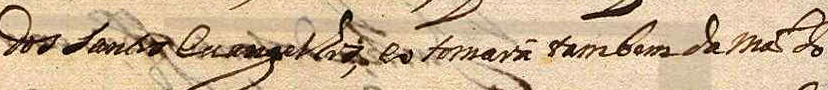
dos Santos Euangelhos, e o tomará tambem da maõ do
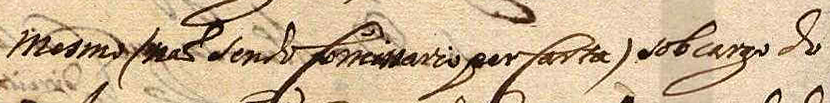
mesmo (naõ sendo Comissario por Carta) sob cargo do
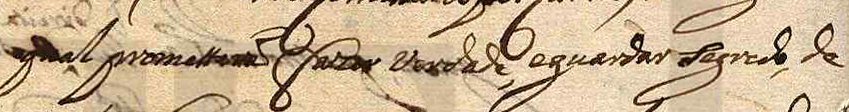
qual prometeu fazer verdade, e guardar segredo de
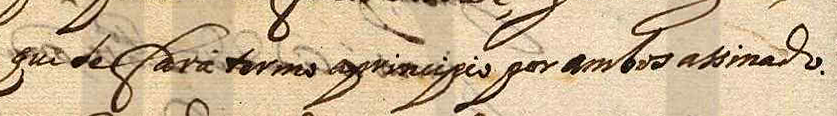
que se fará termo a principio por ambos assinado.
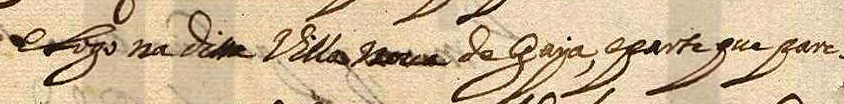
e Logo na ditta Villa noua de Gaya, e parte que pare
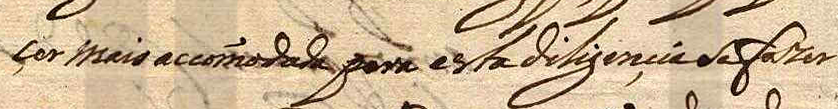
çer mais accom̄odada para esta diligençia se fazer
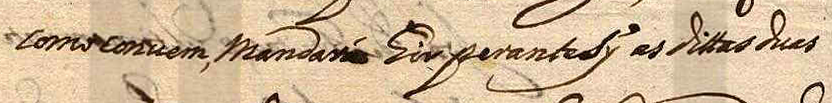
como conuem, mandará hir perante sy as dittas duas
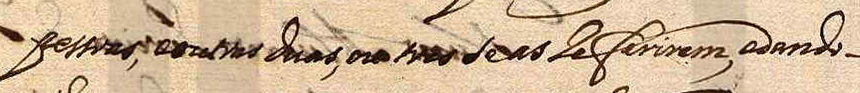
pessoas, e outras duas, ou tres se as Referirem, e dando
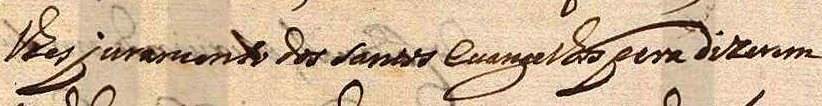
lhes juramento dos santos Euangelhos pera dizerem
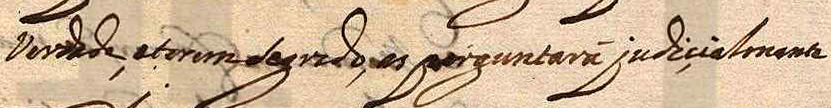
verdade, e terem segredo, as perguntará judiçialmente
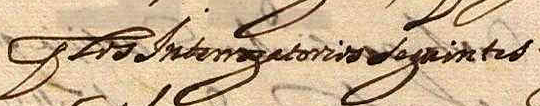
p̄los Interrogatorios seguintes
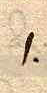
1.
